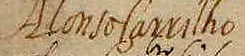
Alonso Carrilho
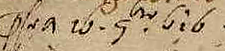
p̄so a 16. 9bro. 6i6
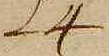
14
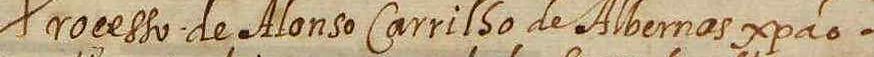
Processo de Alonso Carrilho de Albernos xpaõ
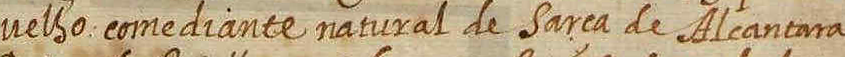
uelho comediante natural de Sarça de Alcantara
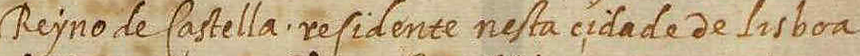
Reyno de Castella. residente nesta cidade de lisboa
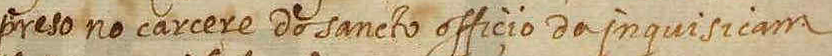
preso no carcere do sancto officio da jnquisiçam
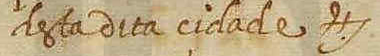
desta dita cidade &ꝭ
